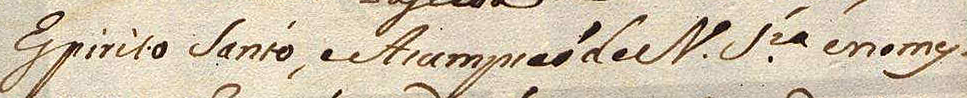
Espirito Santo, e Asumpsaõ de N. S.ra e no mes
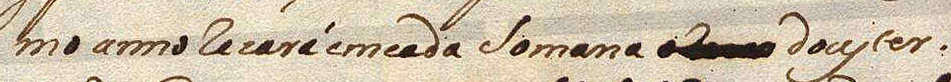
mo anno Rezará em cada somana o d_ dous ter.
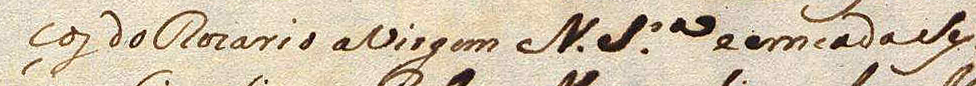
ços do Rozario a Virgem N. S.ra e em cada Ses
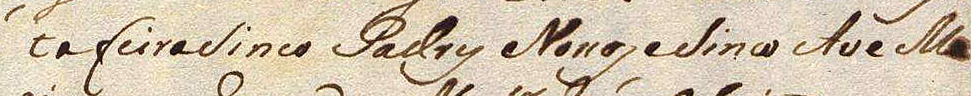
ta feira sinco Padres Nossos e Sinco Ave Ma
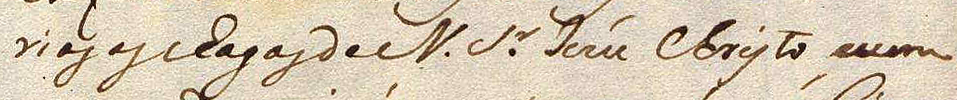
rias as chagas de N. S.r Iezú Christo, cum
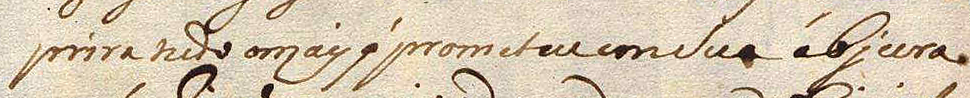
prira tudo o mais q̄ prometeu em Sua abjura
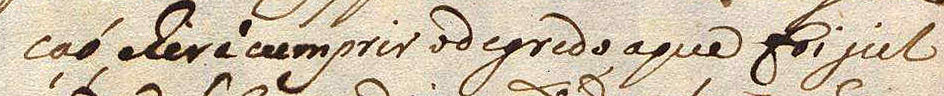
çaõ e hirá cumprir o degredo, a que foi jul
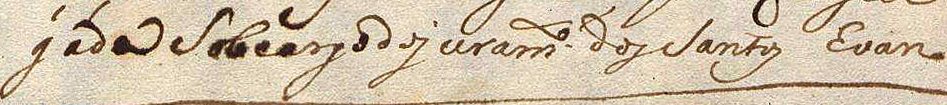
gada Sob cargo do juram.to dos Santos Evan
